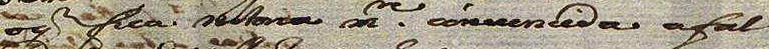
o q̄ fica notoriam.te conuencida a fal
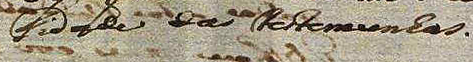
sidade das testemunhas.
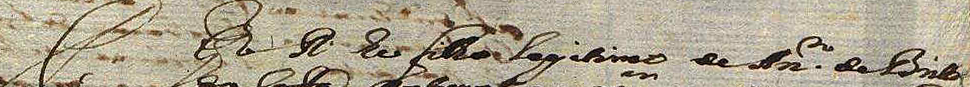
P. Q̄ R. he filho legitimo de Ant.o de Britto
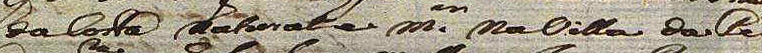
da Costa natural e m.or na Villa da Pe
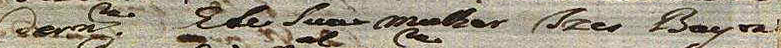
dernra E de sua mulher Izes Bayoa
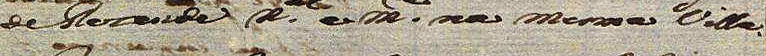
de Rezende n.al e m.ra na mesma villa
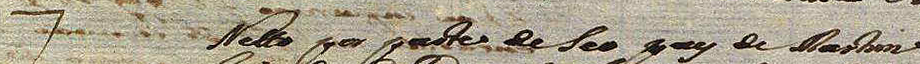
7 Netto por parte de seo pay de Martim
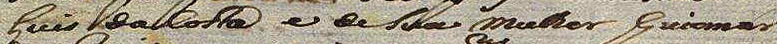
Luis da Costa e de sua mulher Guiomar
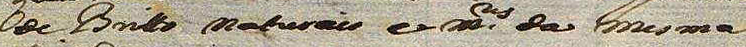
de Britto naturais e m.res da mesma
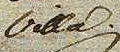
villa.
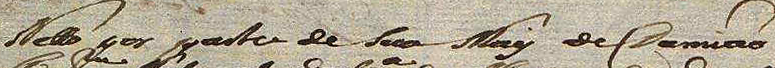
Netto por parte de sua May de Damião
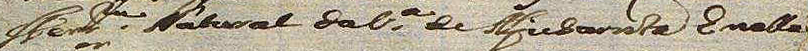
Ferrra. Natural da v.a de Aljubarrota E nella
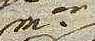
mo.r
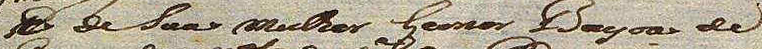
E de sua mulher Leonor Bayoa de
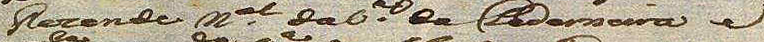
Rezende na.l da v.a da Pederneira e
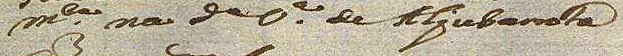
mr.a na da va. de Aljubarrota
